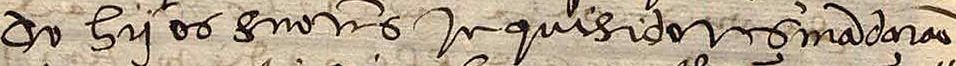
do hij os snorēs Jnquisidores mādaraõ
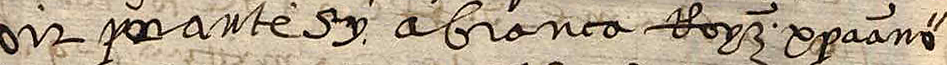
vir perante sy a branca Royz̄ xpaā no
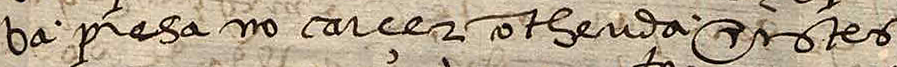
va presa no carçer cōtheuda ē estes
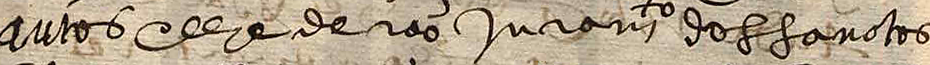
autos e lhe deraõ Juramto dos sanctos
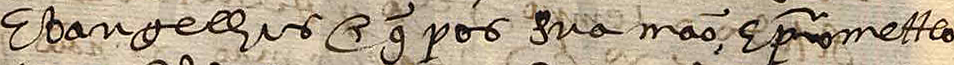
Evangelhos ē q̄ pos sua maõ, E p̄rometteo
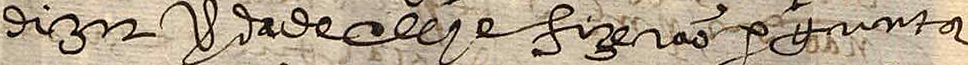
dizer Ꝟdade e lhe fizeraõ ꝑguntas
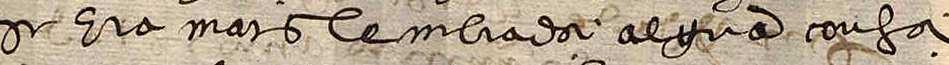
se Era mais lembrada alguā cousa
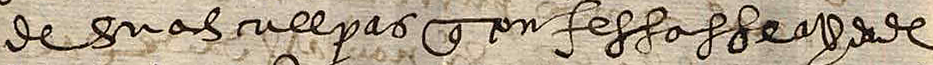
de suas cullpas q̄ confessasse a ꝟdade
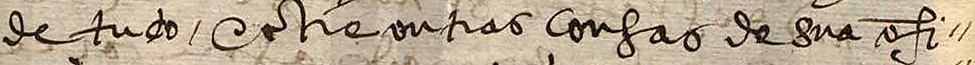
de tudo / e ētre outras cousas de sua cōfi
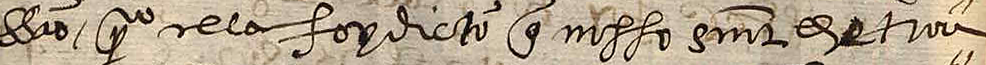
ssaõ / p̄o ella foy dictō que nosso sn̄or lhe trou
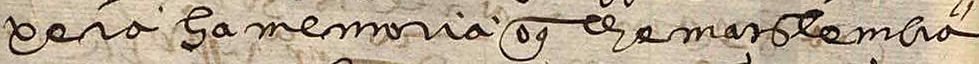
xera ha memoria o q̄ lhe mais lembra
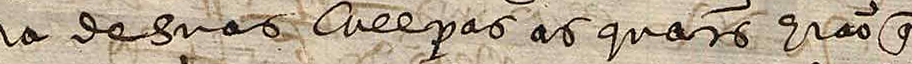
ra de suas cullpas as quaēs Eraõ q̄
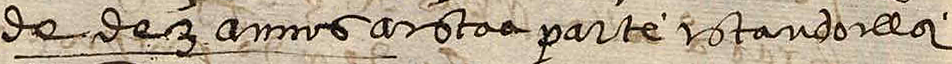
de dez̄ annos a estaa parte estando ella
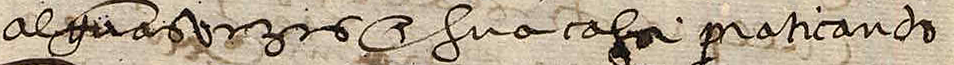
algūas vezes ē sua casa praticando
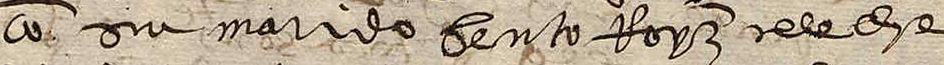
cō seu marido bento Royz̄ elle lhe
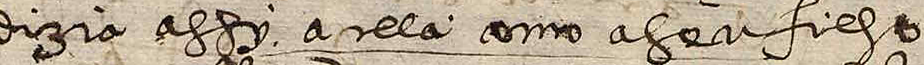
dizia assy a ella como a seu filho
